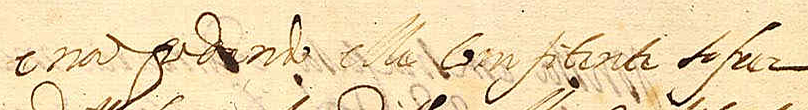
e naõ podendo elle comfitente sofrer
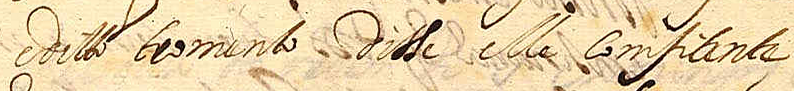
o ditto tromento disse elle comfitente
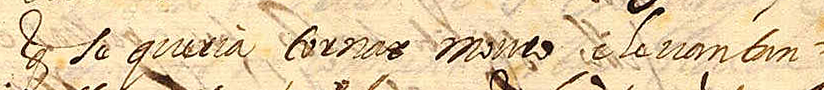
q̄ se queria tornar mouro e leuantan
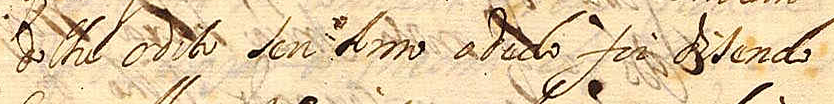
dolhe o dito seu Amo o dedo foi disendo
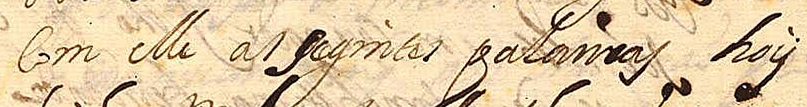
com elle as segintes palauras hoy
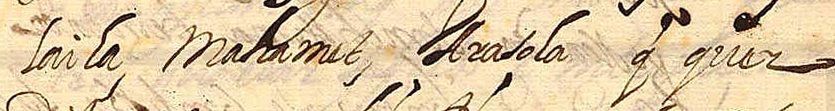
lai ha mahamet, Arasola q̄ quer
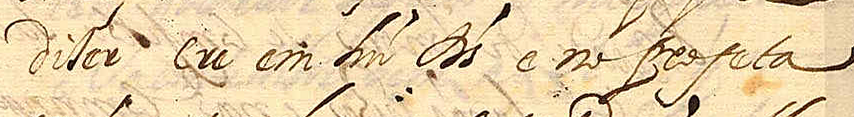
diser cre em hū Ds̄ e no profeta
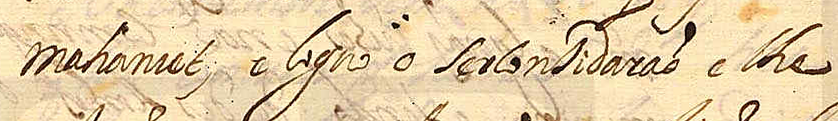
mahamet, e loguo o serconsidaraõ e lhe
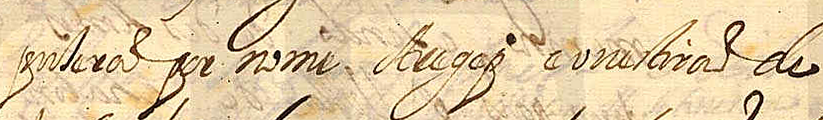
puseraõ por nome Aregep e o uestiraõ de
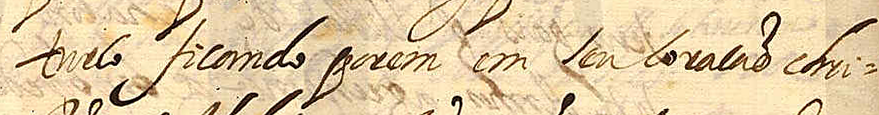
turco ficando porem em seu coraçaõ chri
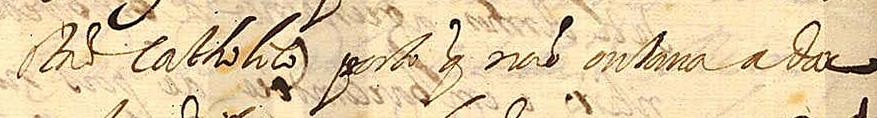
staõ catholico posto q̄ naõ ousaua a dar
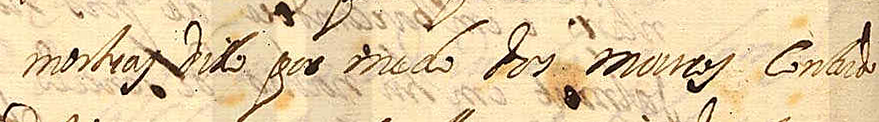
mostras disso por medo dos mouros contudo
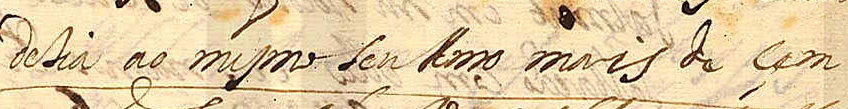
desia ao mesmo seu Amo mais de cem
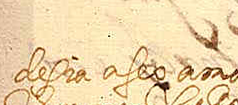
desia a seo amo
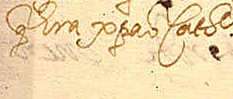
q̄ Era xpaõ Cath.co
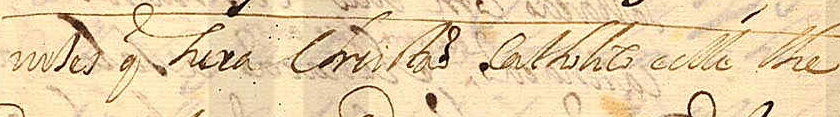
ueses q̄ hera Christaõ catholico e elle lhe
